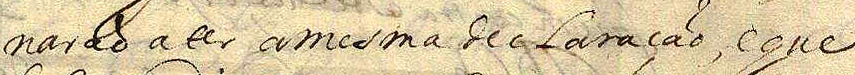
naraõ a ter a mesma declaraçaõ, e que
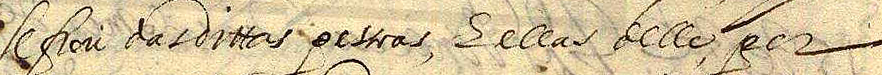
se fiou das dittas pessoas, E ellas delle, por
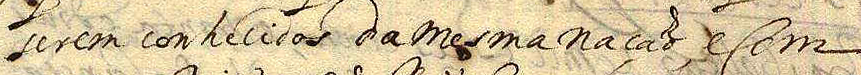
serem conhecidas da mesma naçaõ, e Com
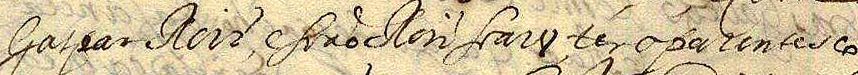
Gaspar Roiz̄, e joão Roiz̄ soares, ter o parentesco
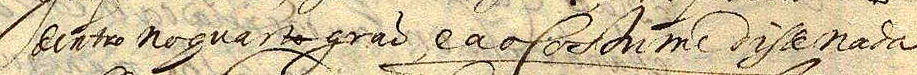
dentro no quarto grao, e ao Costume disse nada
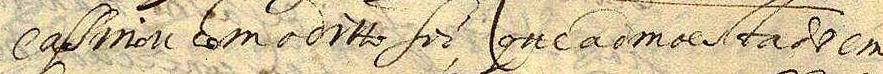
e assinou com o ditto sor̄, que admoestado em
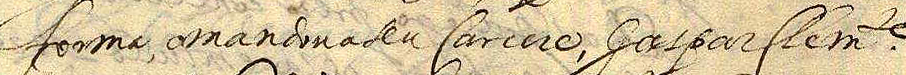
forma, o mandou a seu Carcere, Gaspar Clemte.
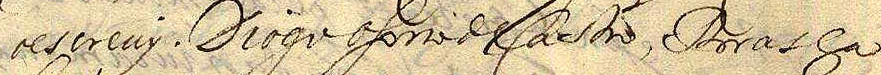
o escreuy. Diogo osorio de Castro, Bras Ga
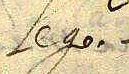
Lego.
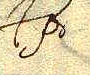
tp̄o
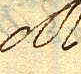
o R
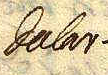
declar
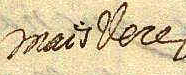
mais Vezes
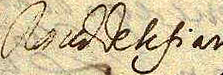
Razão de se fiar
